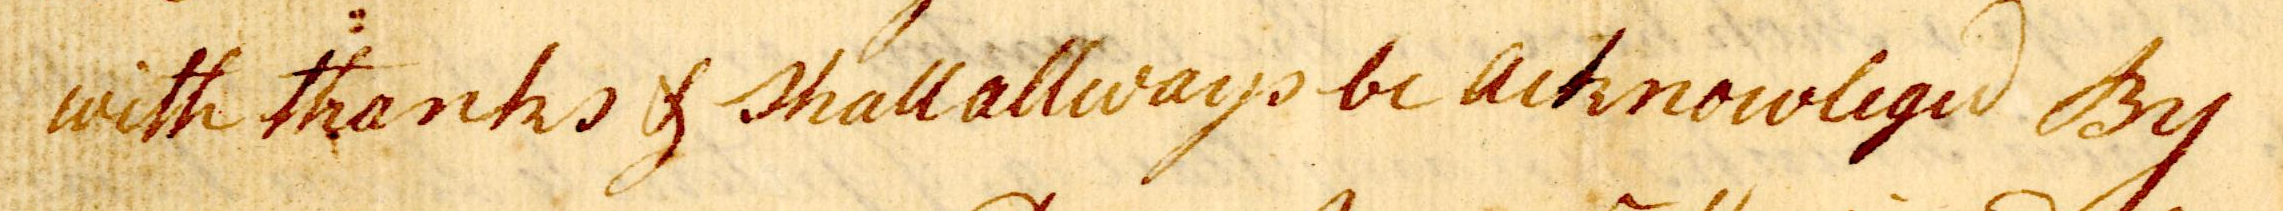with thanks & shall allways be Acknowleged By
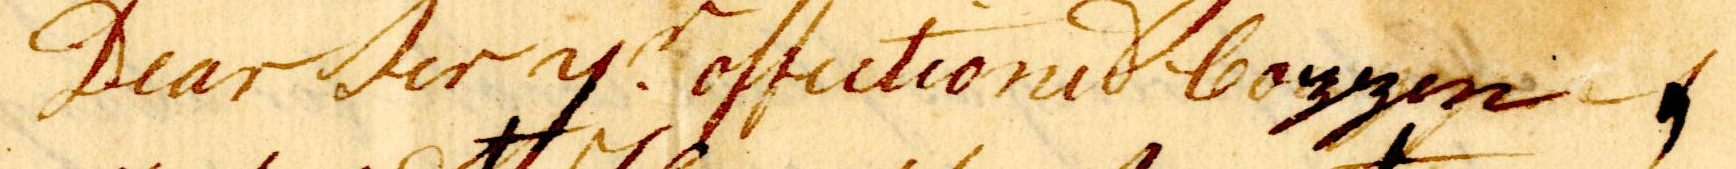Dear Sir y^r. affectioned Cozzin &
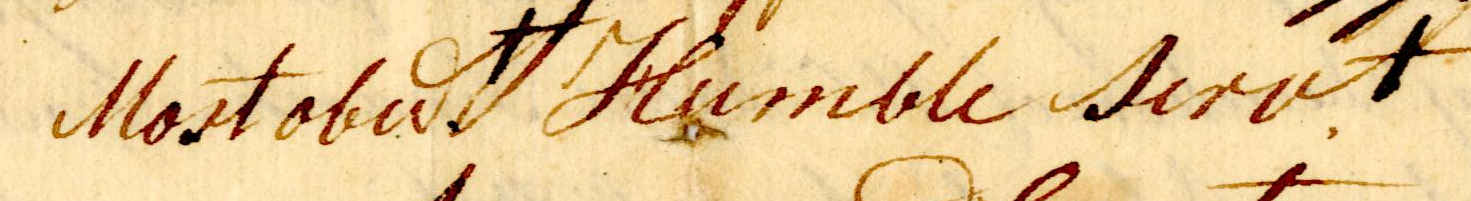Most obed^t Humble serv^t.
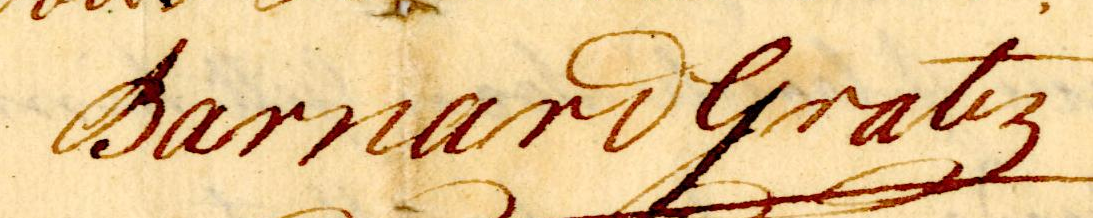Barnard Gratz
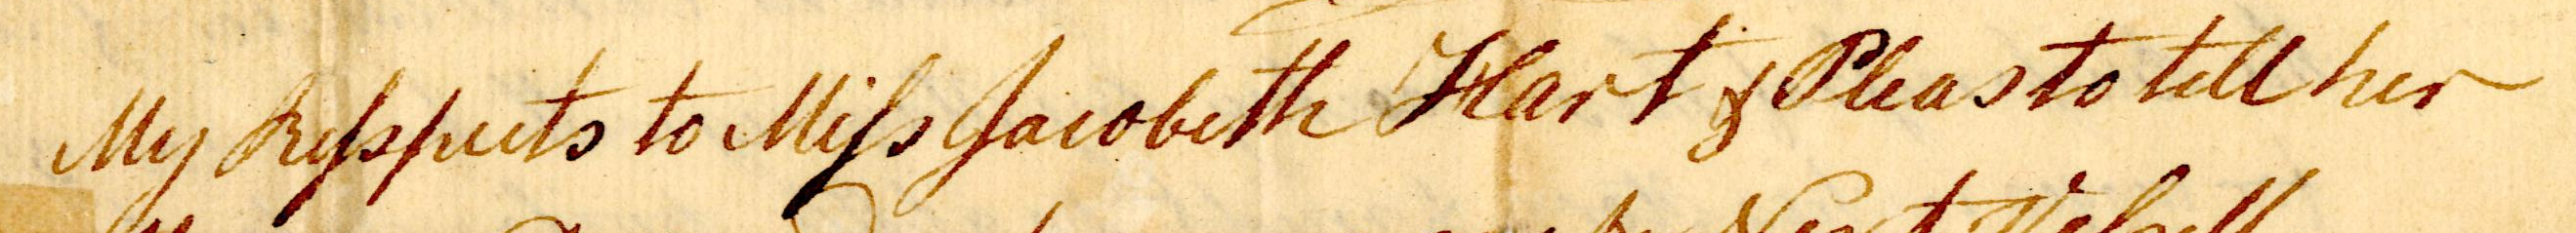My Resspects to Miss Jacobeth Hart & Pleas to tell her
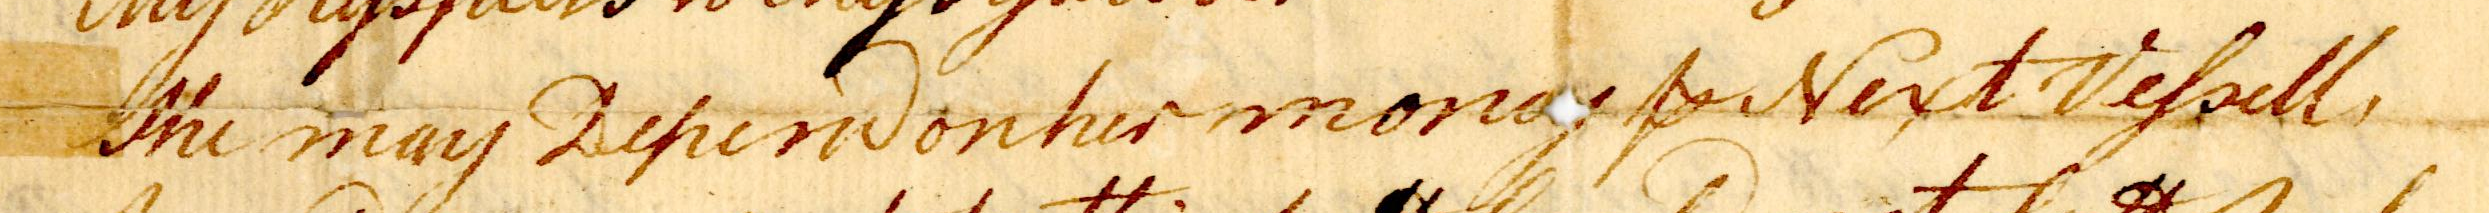She may Depend on her money per Next Vessell,
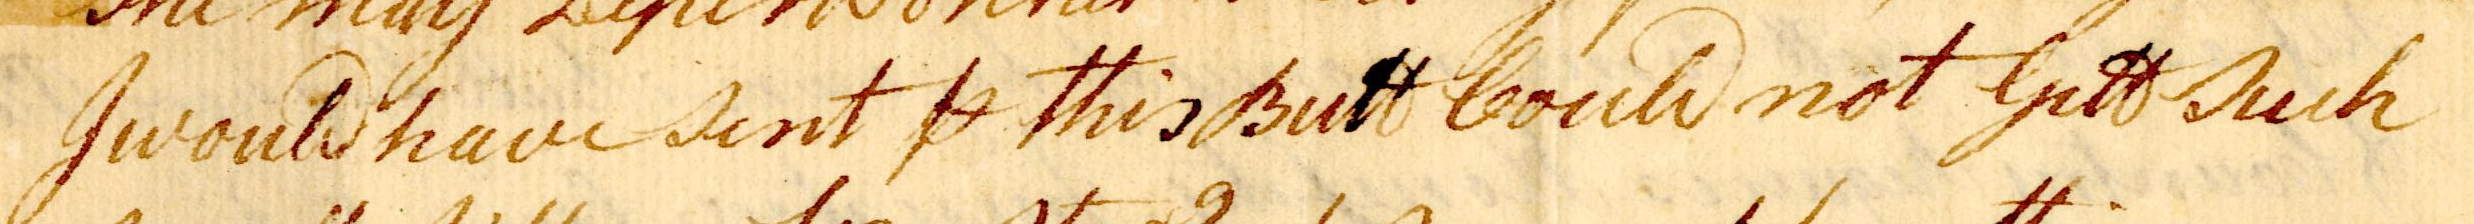I would have sent & this Butt could not Gett such
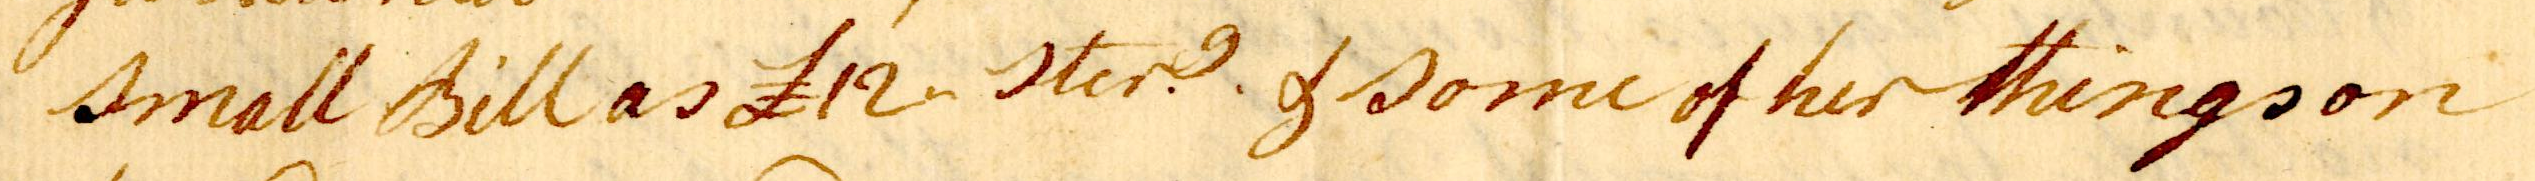small Bill as £12 ster^g. & some of her things on
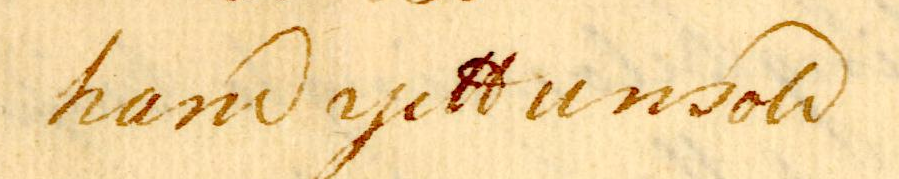hand yett unsold
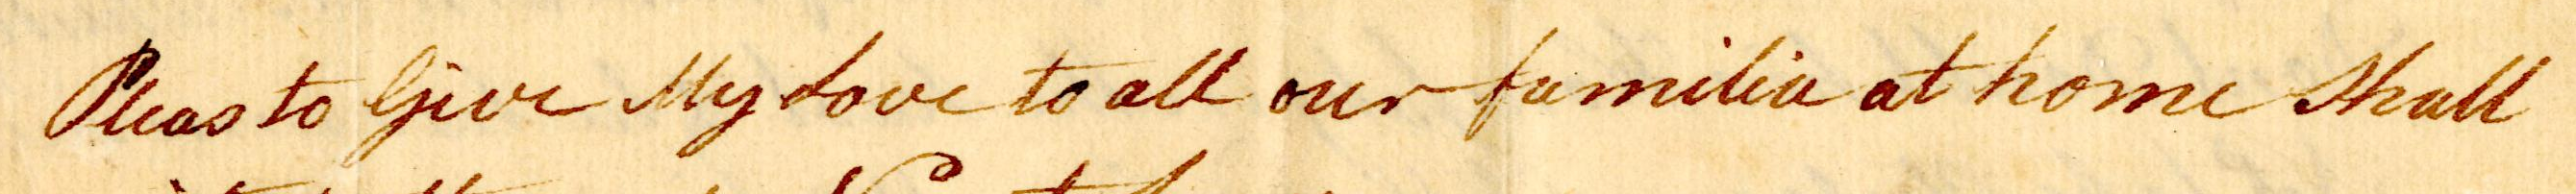Pleas to Give My Love to all our families at home shall
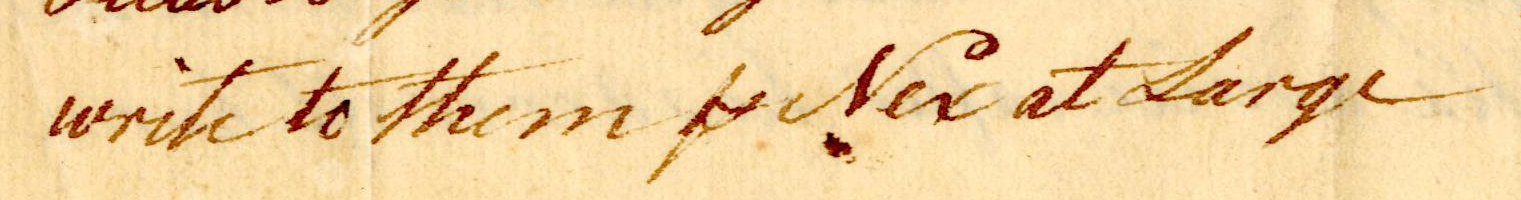write to them per Nex at Large
